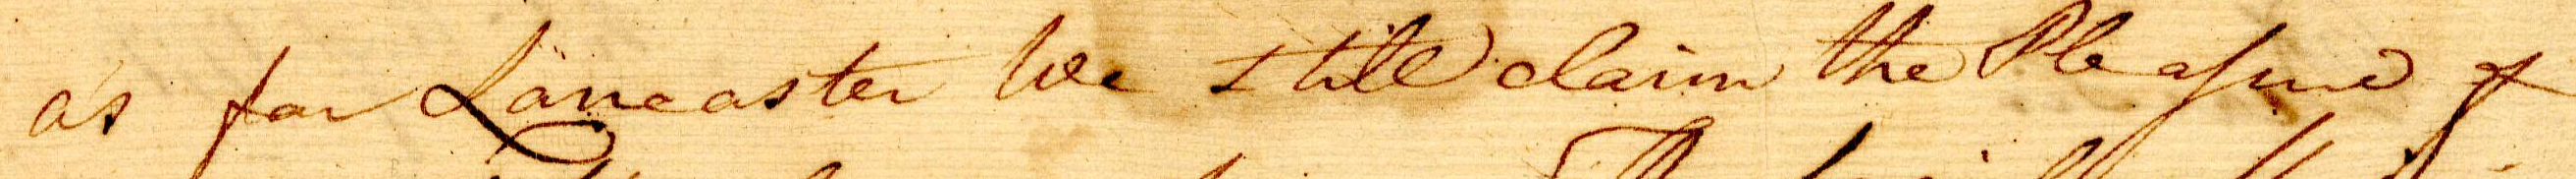as for Lancaster We still claim the Pleasure of
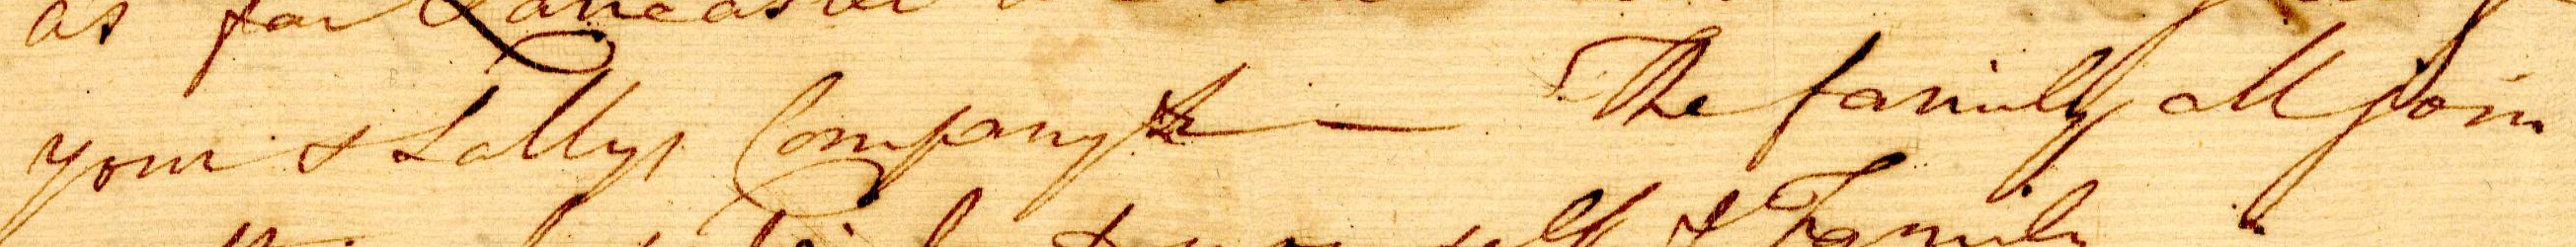your & Sallys Company- The family all join
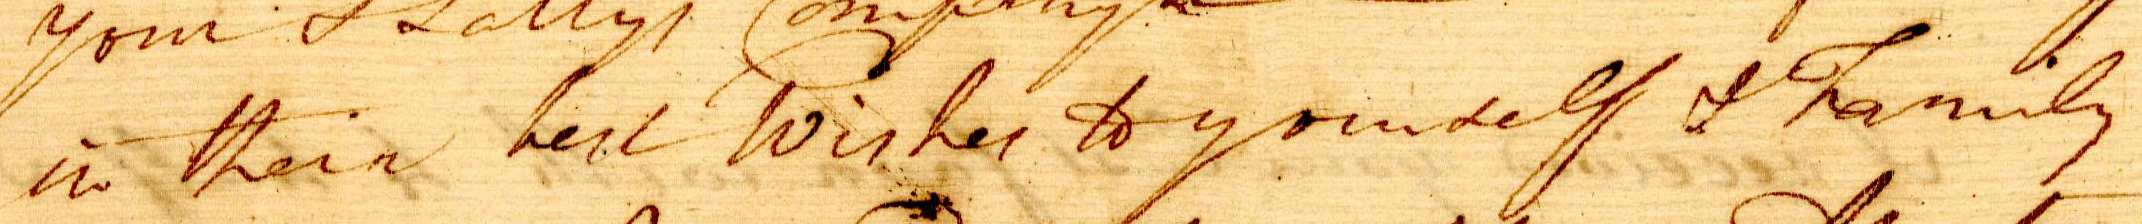in their best Wishes to yourself & Family
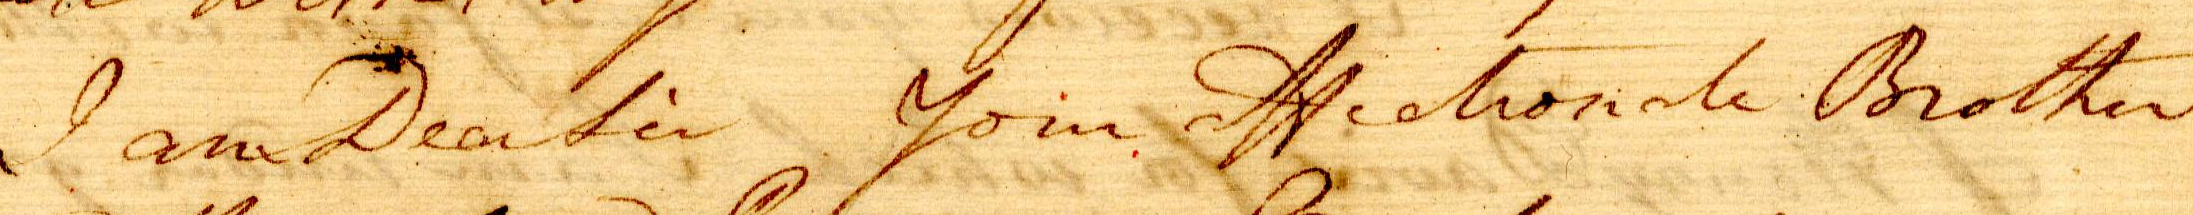I am Dear Sir Your affectionate Brother
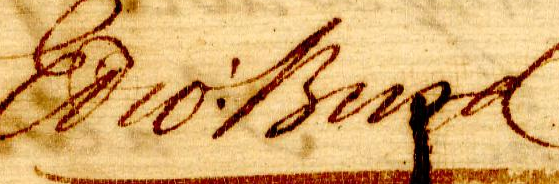Edw: Burd
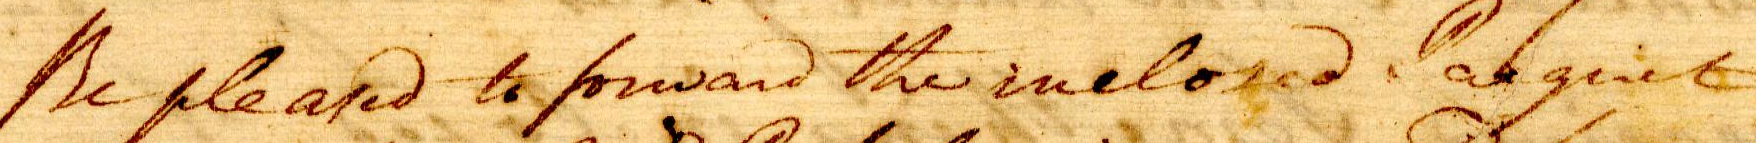Be pleased to forward the inclosed against
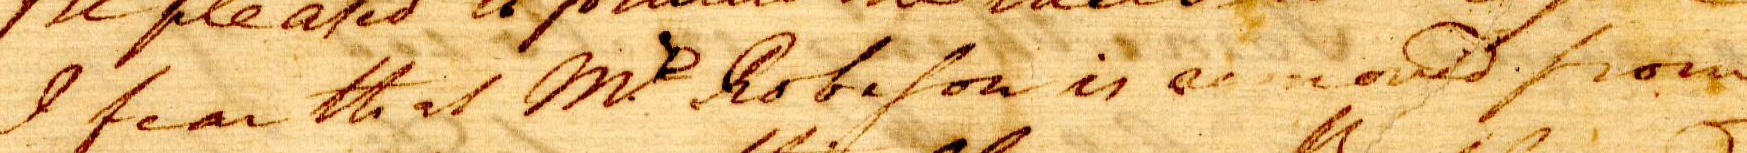I fear that M^r. Robeson is remov'd from
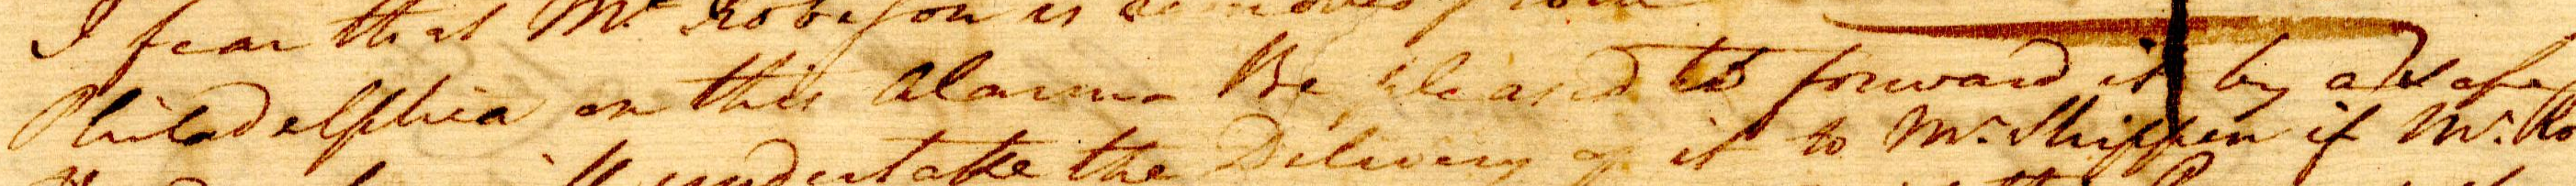Philadelphia on this Alarm. Be pleased to forward it by all of a
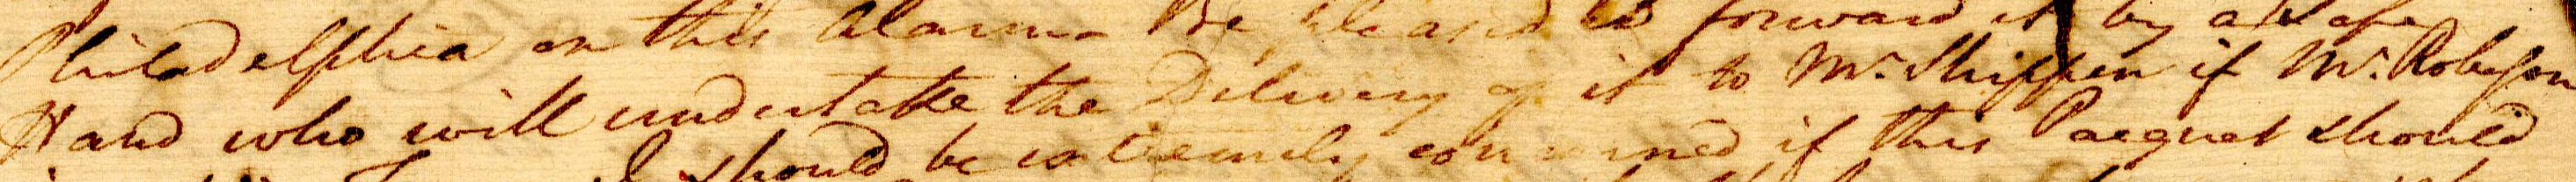Hand who will undertake the Delivery of it to M^r. Shippen if M^r. Robeson
